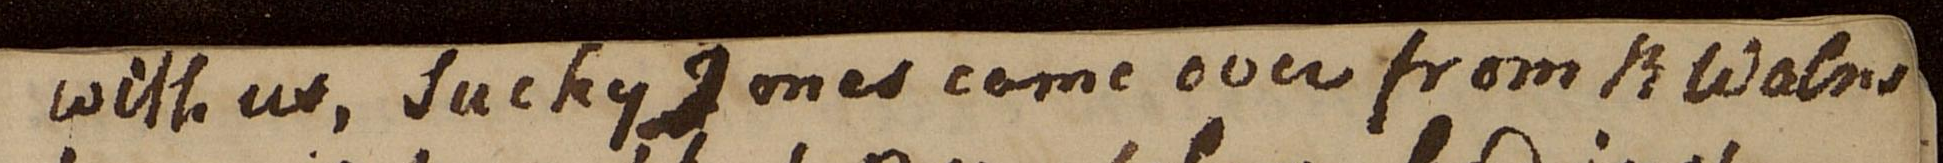with us, Sucky Jones came over from R Walns
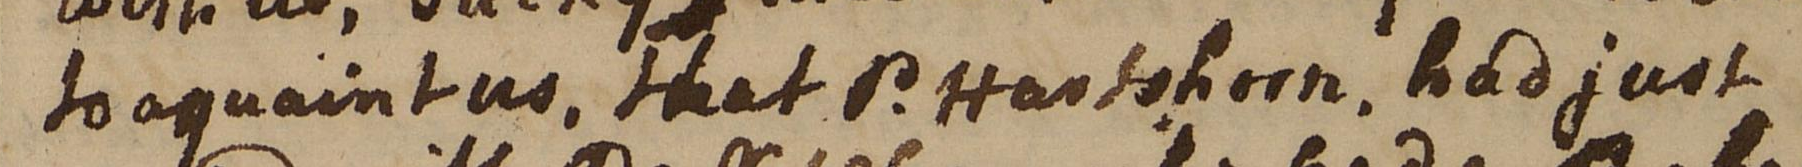to aquaint us, that P. Hartshorn, had just
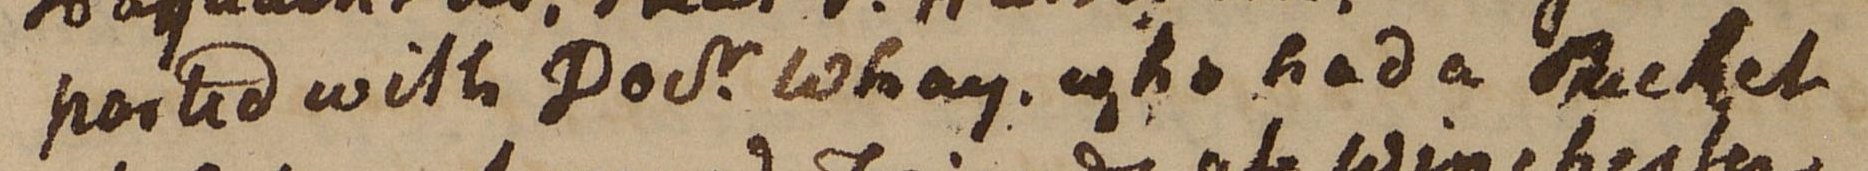parted with Doc^r. Whay. who had a Pucket
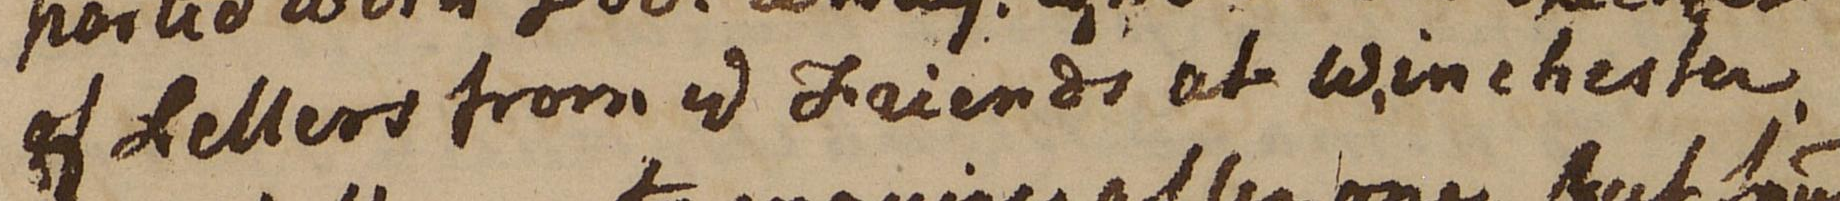of Letters from y^e Friends at Wiinchester,
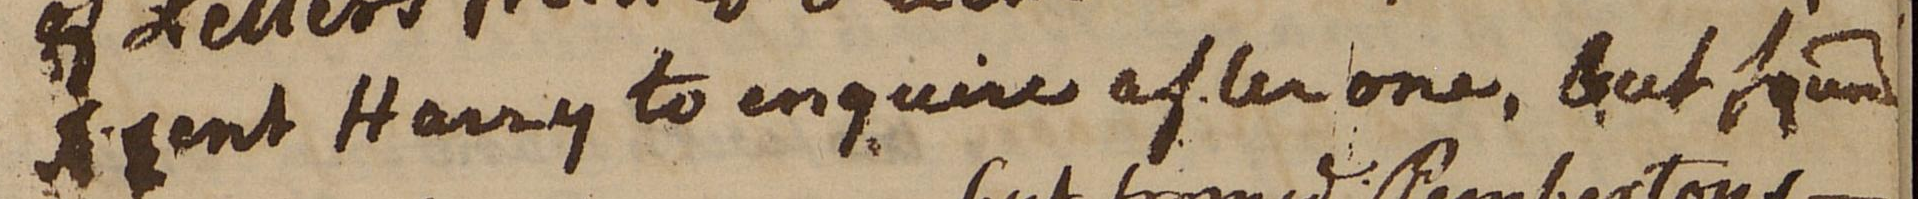I sent Harry to enquire after one, but found
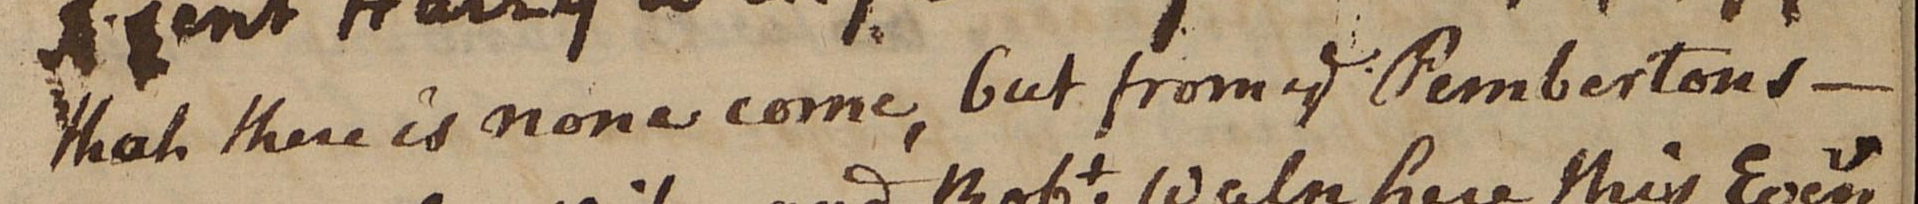that there is none come, but from y^e Pembertons-
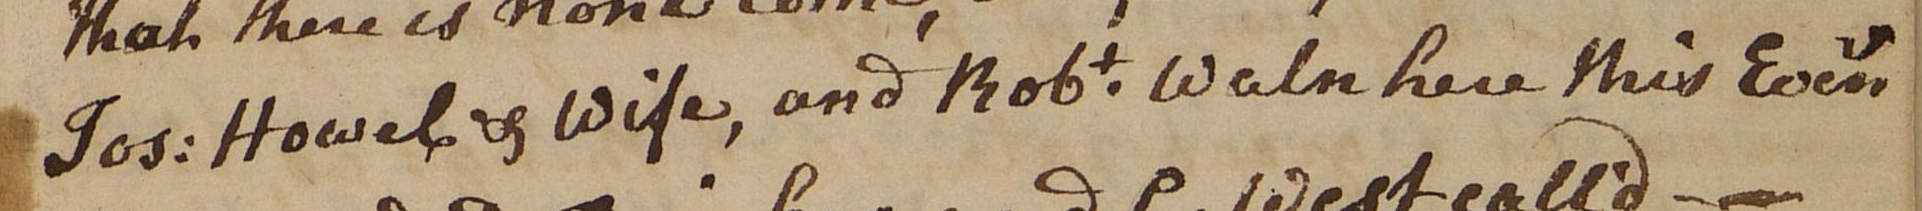Jos: Howel & Wife, and Rob^t. Waln here this Even^g
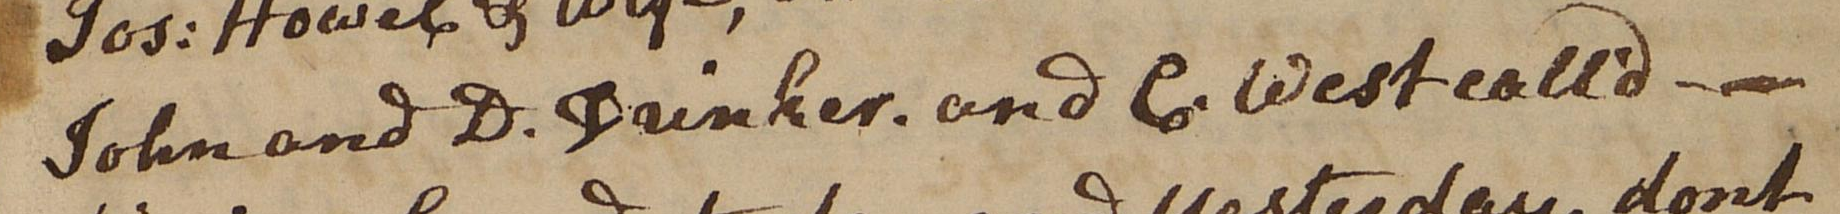John and D. Drinker. and C. West call'd-
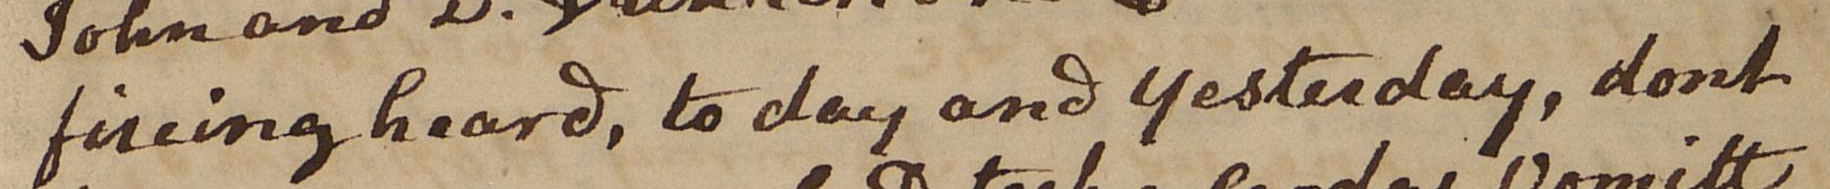fireing heard, to day and yesterday, dont
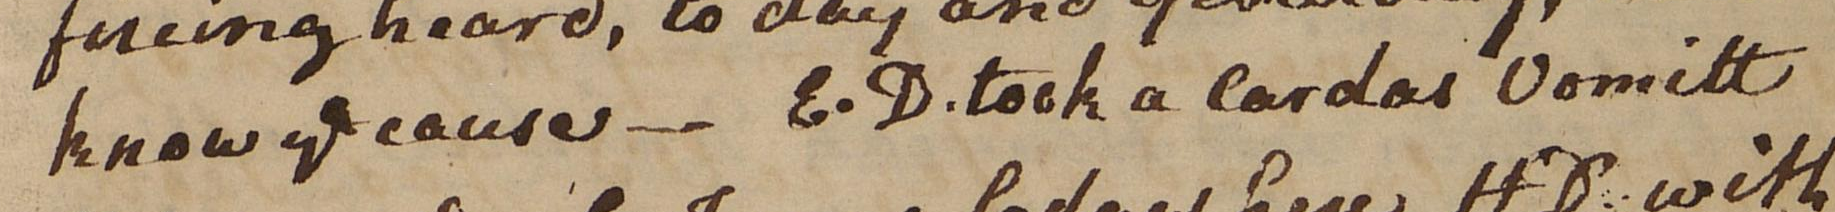know y^e causes- E.D. took a Cardas Vomitt
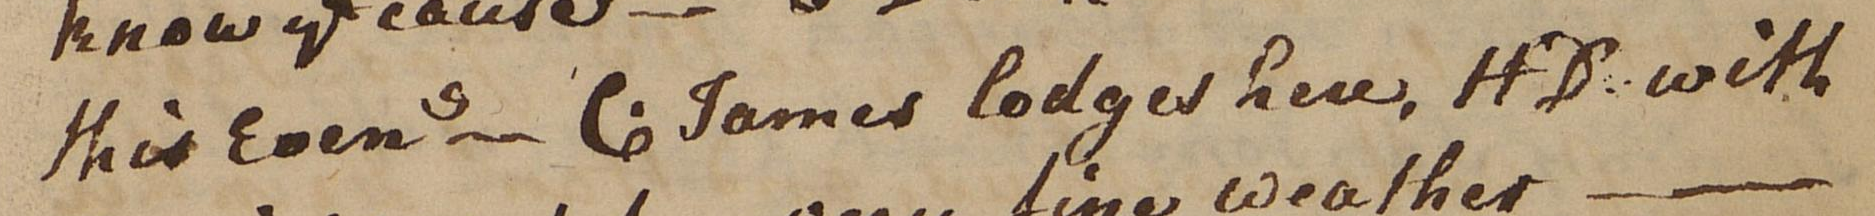this Even^g- C. James lodges here, HD. with
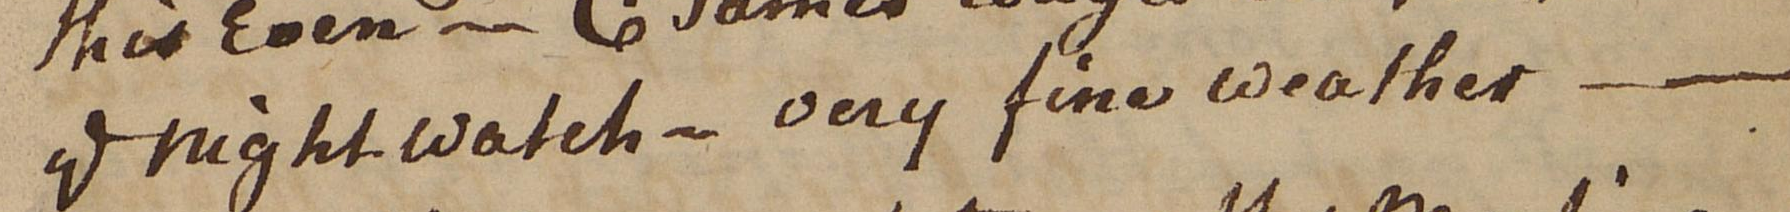y^e night Watch- very fine weather-
